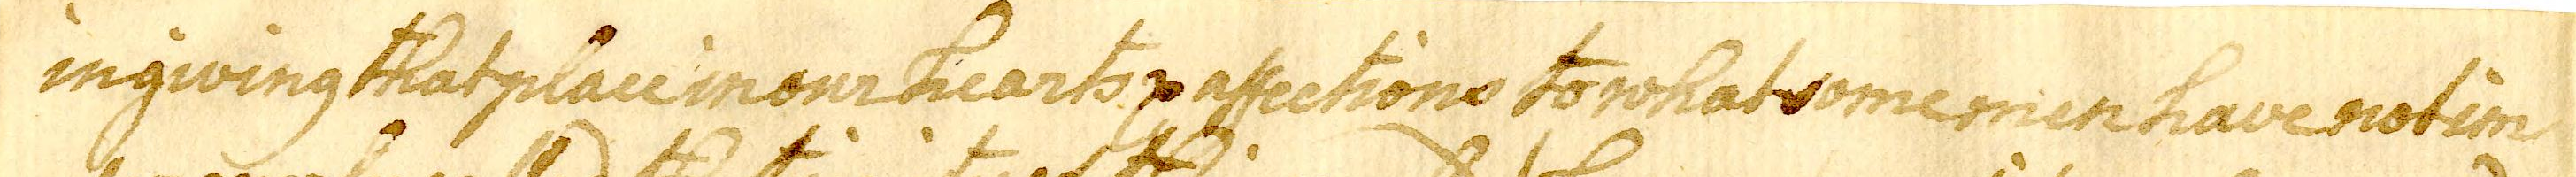in giving that place in our hearts& affections to what some men have not im
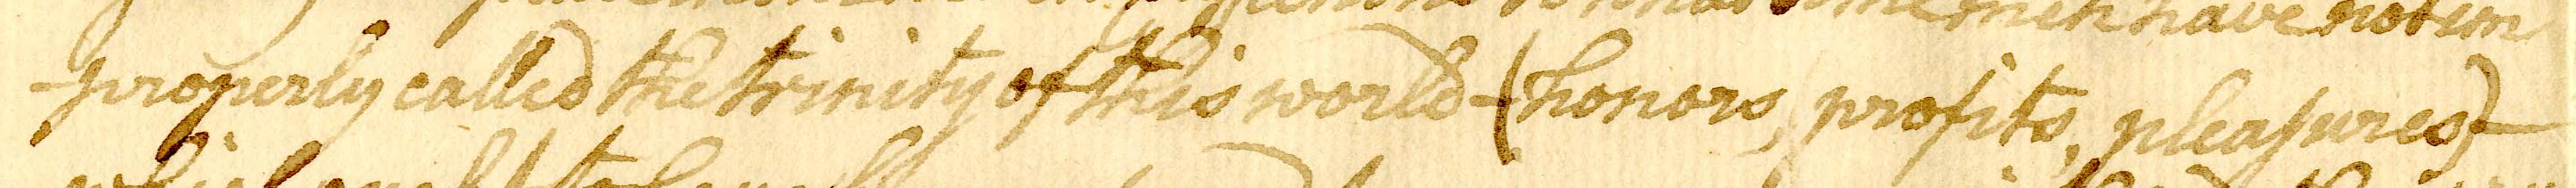-properly called the trinity of this world -(honors, profits, pleasures)-
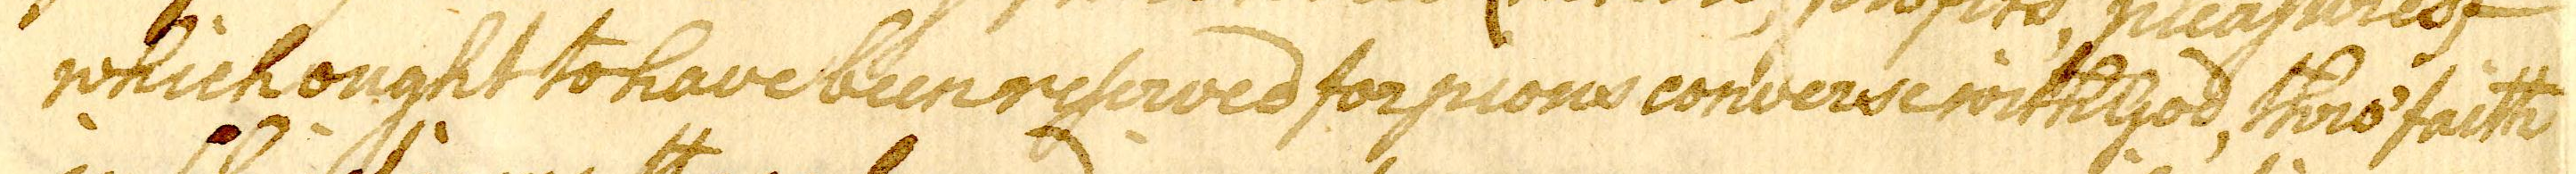which ought to have been reserved for pious converse with God, thro' faith
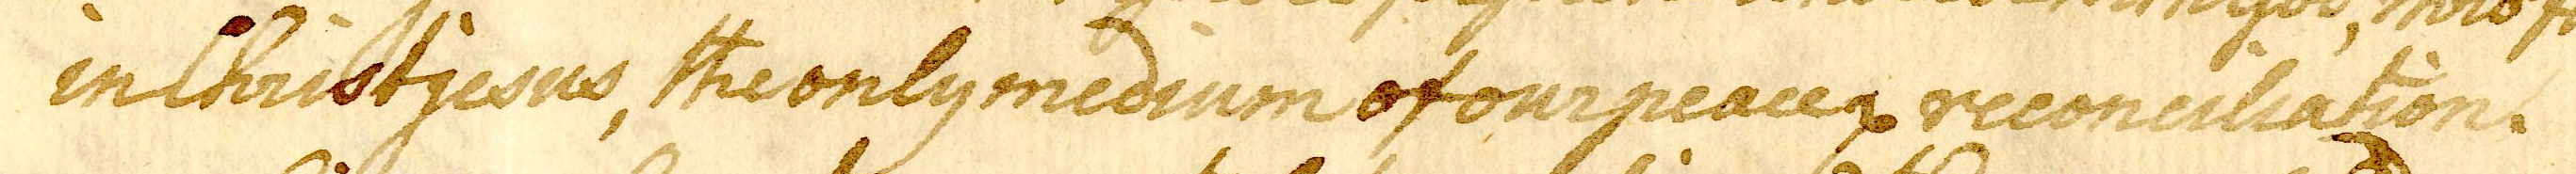in Christ jesus, the only medium of our peace & reconciliation.
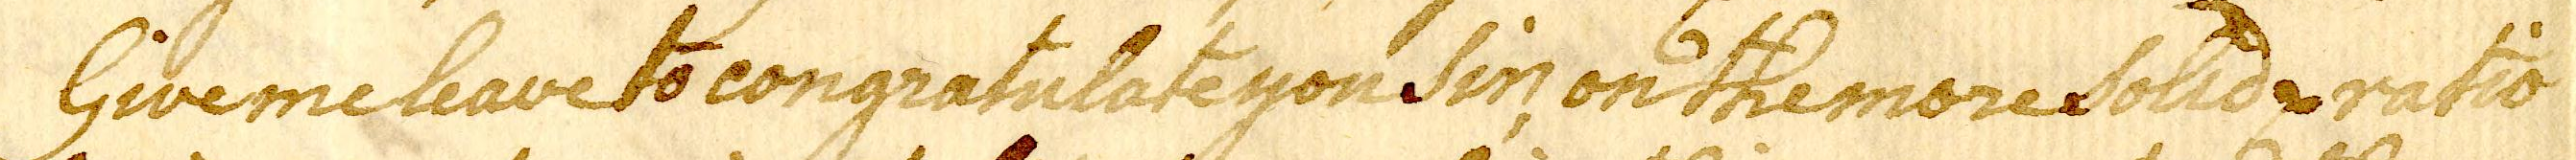Give me leave to congratulate you Sir on the more solid ratio
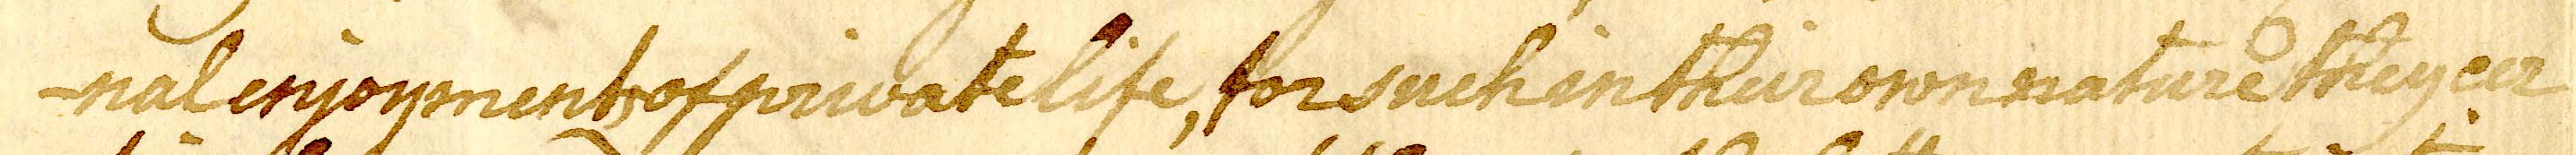-nal enjoyment of private life, for such in their own nature they cer
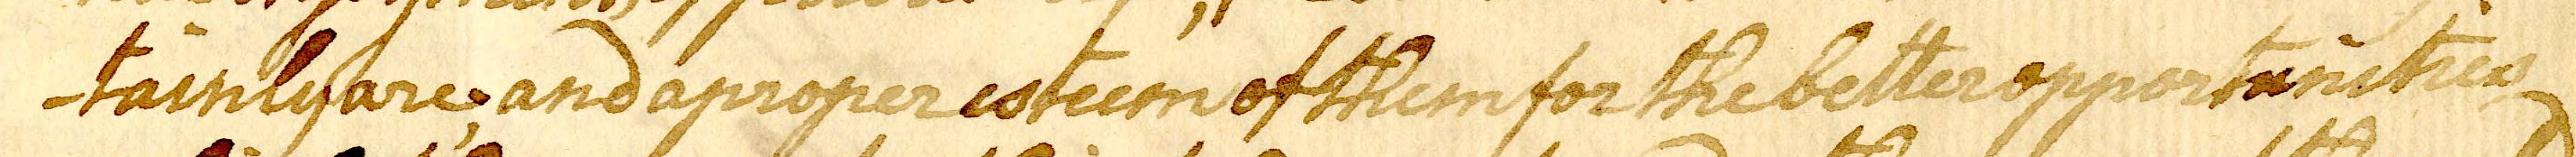-tainly are and a proper esteem of them for the better opportunities
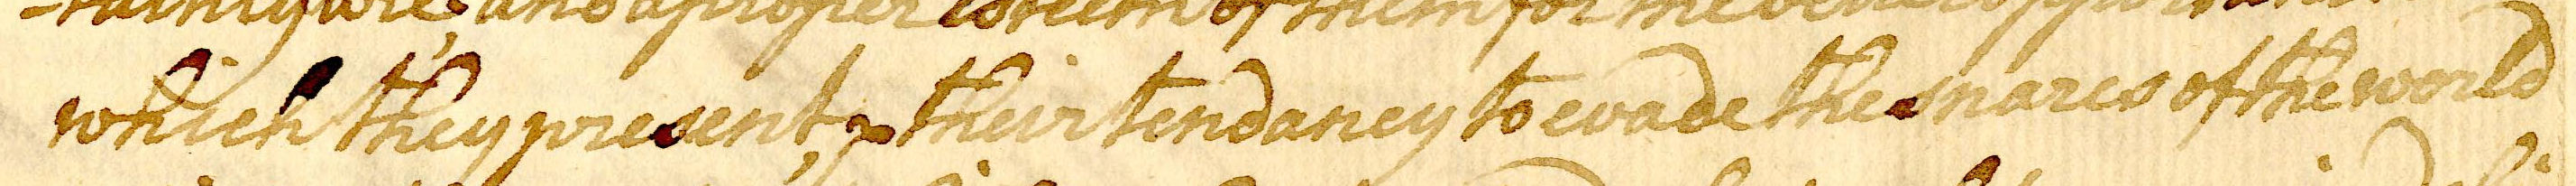which they present, their tendancy to evade the snares of the world
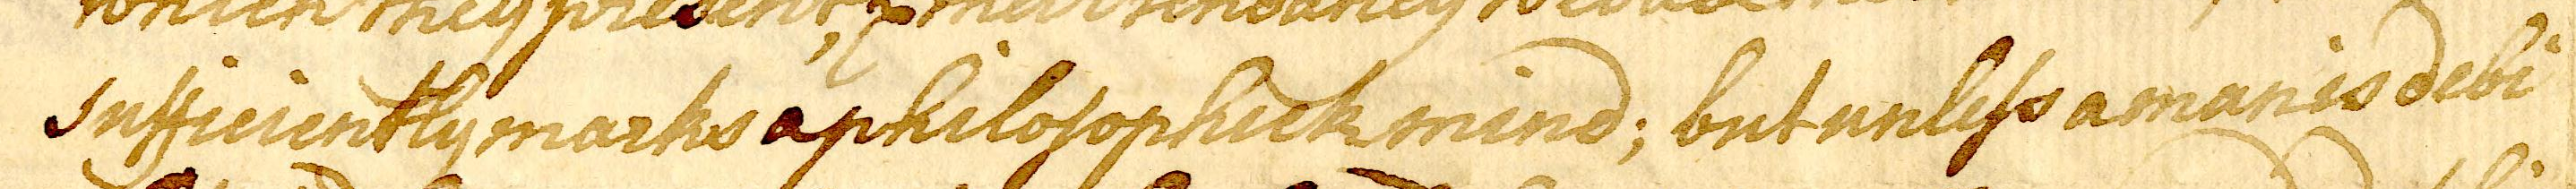sufficiently marks a philosophick mind; but unless a manis debi
